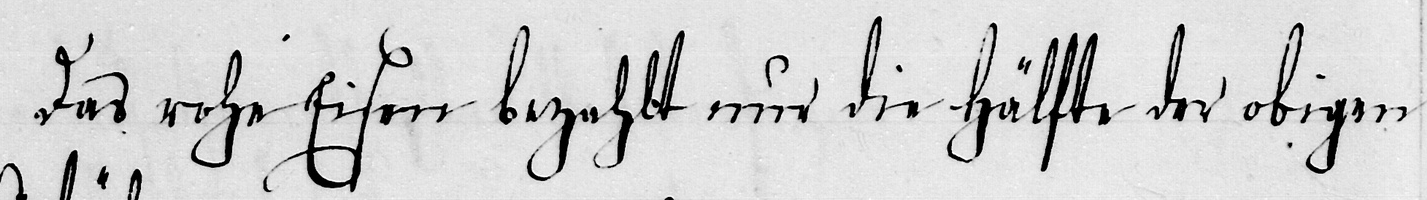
Das rohe Eisen bezahlt nur die Hälfte der obigen
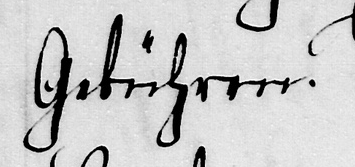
Gebühren.
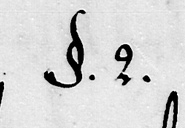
§. 2.
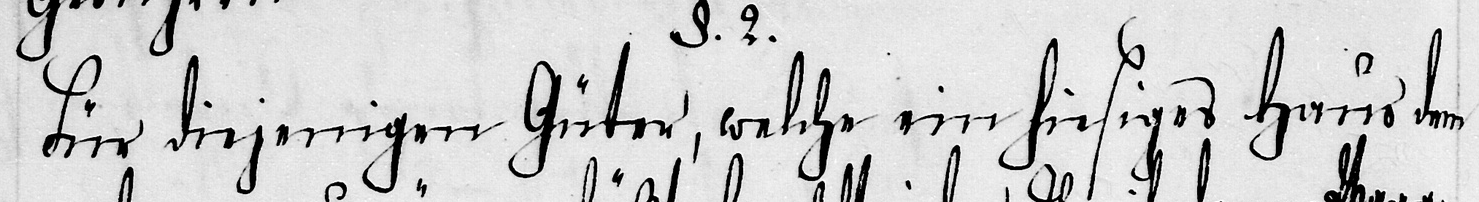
Für diejenigen Güter, welche ein hiesiges Haus dem
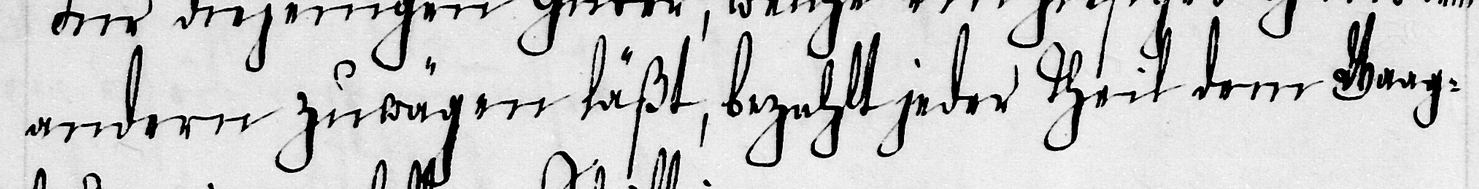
andern zuwägen läßt, bezahlt jeder Theil dem Waag¬
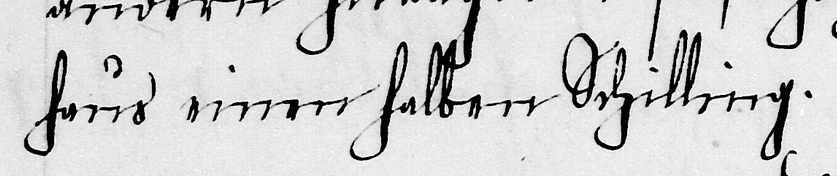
haus einen halben Schilling.
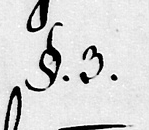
§. 3.
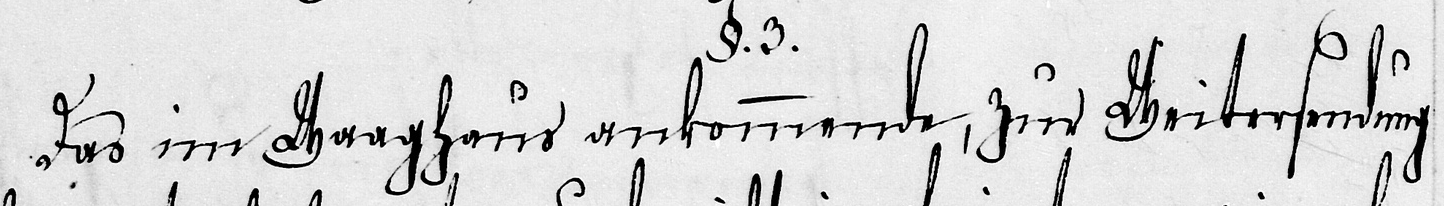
Das im Waaghaus ankommende, zur Weitersendung
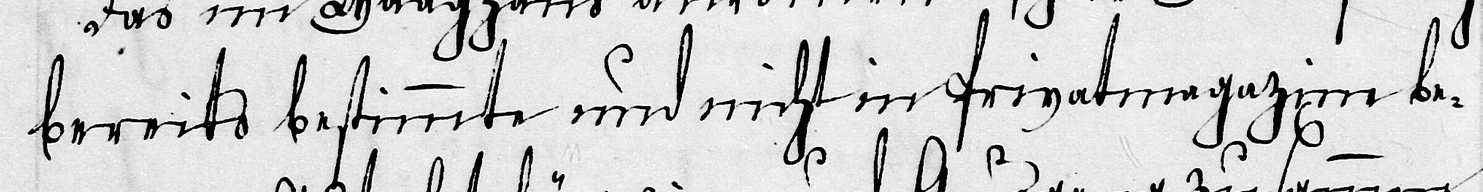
bereits bestimmte und nicht in Privatmagazine be¬
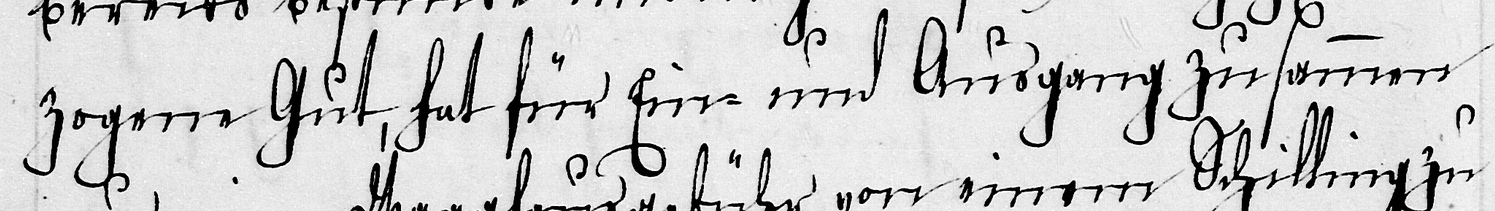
zogene Gut, hat für Ein- und Ausgang zusammen
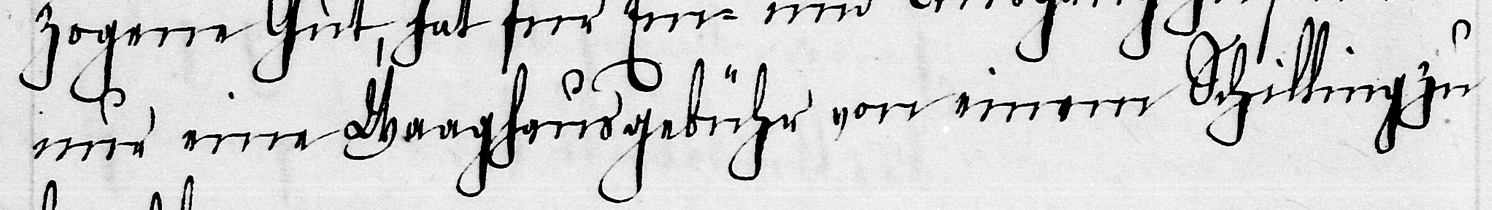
nur eine Waaghausgebühr von einem Schilling zu
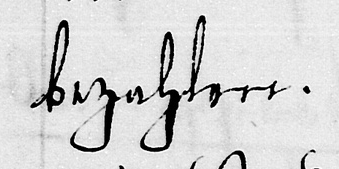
bezahlen.
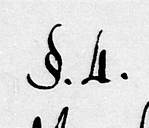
§. 4.
